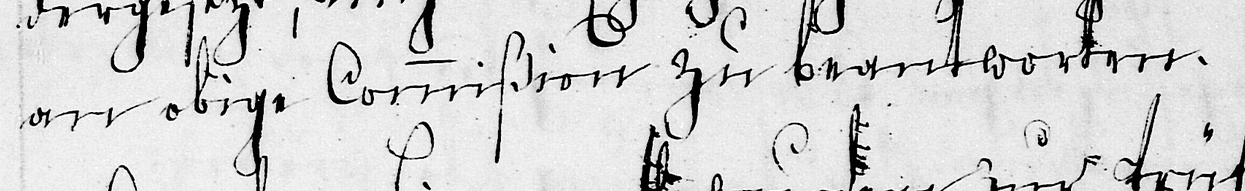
an obige Commißion zu beantworten.
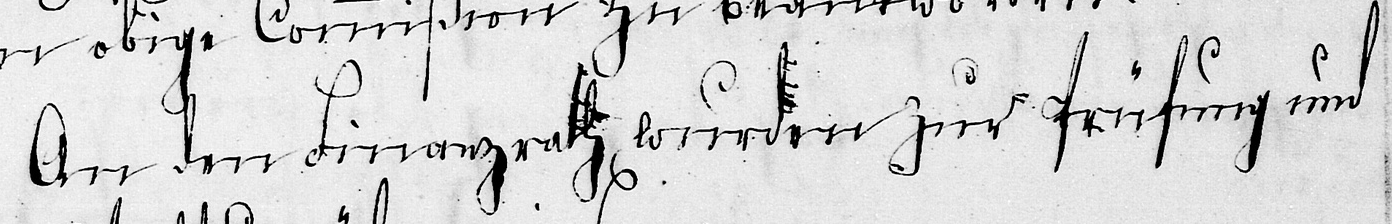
An den Finanzrath wurden zur Prüfung und
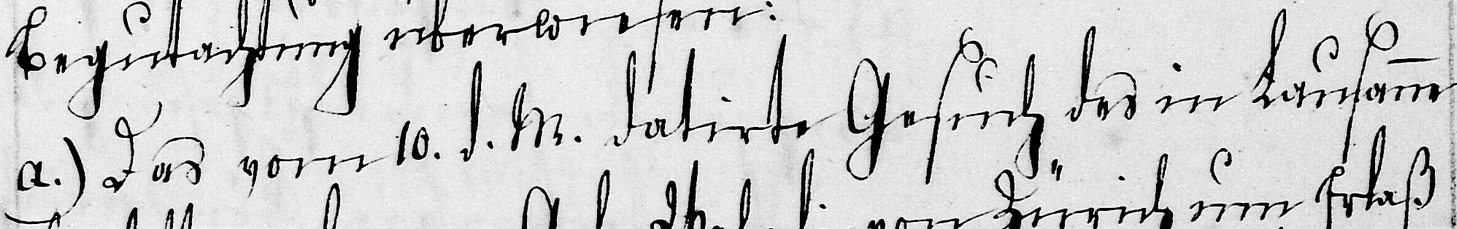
a.) Das vom 10. d. M. datirte Gesuch des in Lausan¬
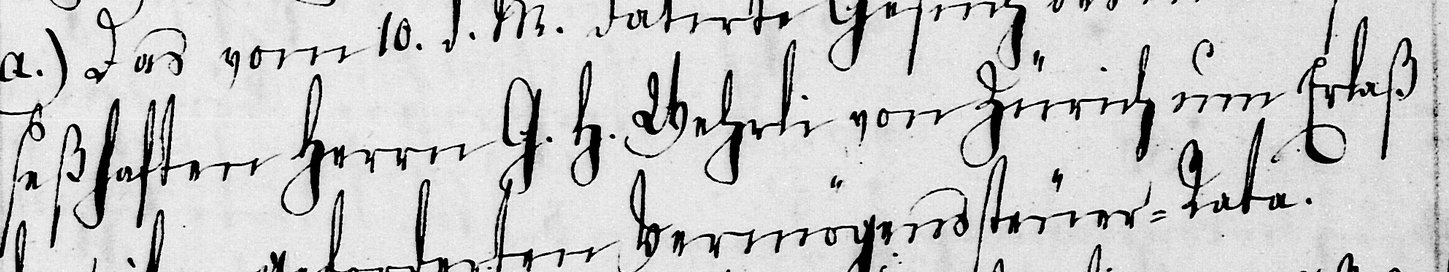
eßhaften Herrn G. H. Wehrli von Zürich um Erlaß
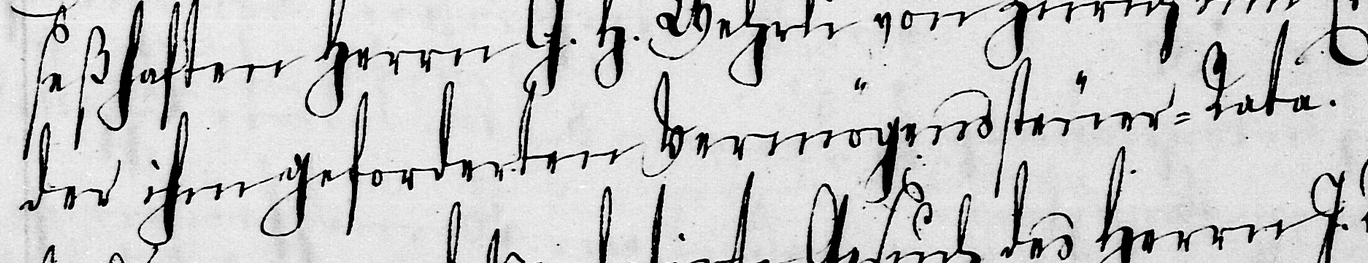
der ihm geforderten Vermögenssteuer-Rata.
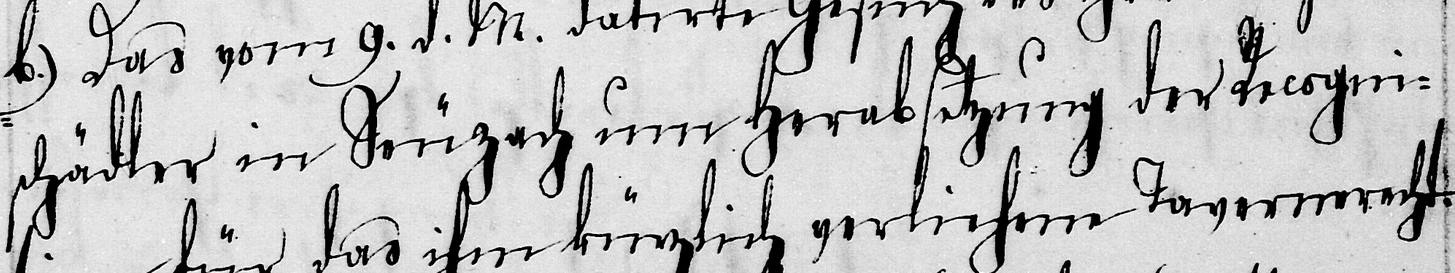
schädler in Seuzach um Herabsetzung der Recogni¬
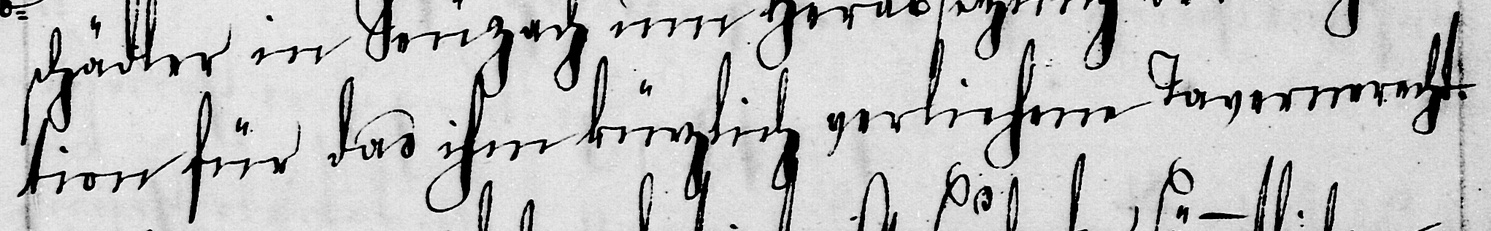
tion für das ihm kürzlich verliehene Tavernerecht.
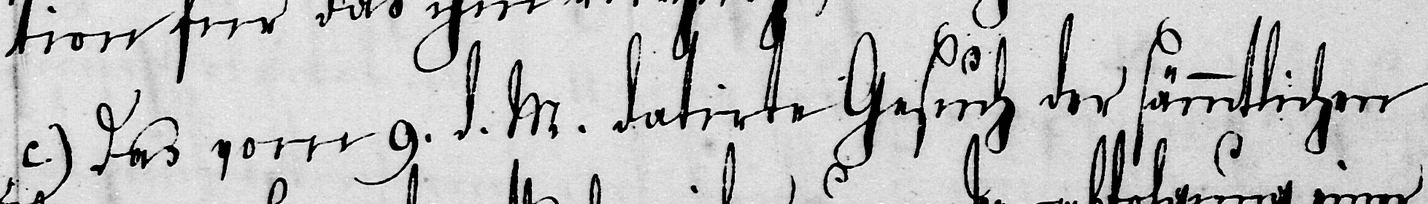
c.) Das vom 9. d. M. datirte Gesuch der sämmtlichen
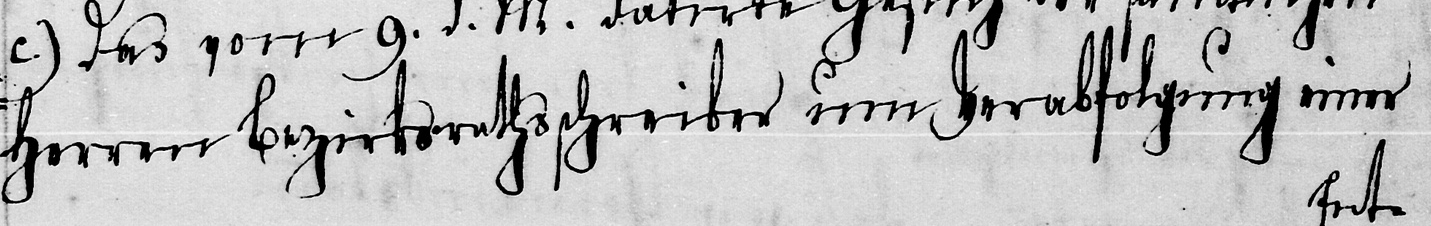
Herren Bezirksrathsschreiber um Verabfolgung einer
